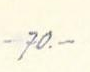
70
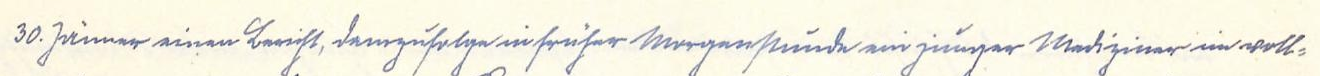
30. Jänner einen Bericht, demzufolge in früher Morgenstunde ein junger Mediziner im voll-
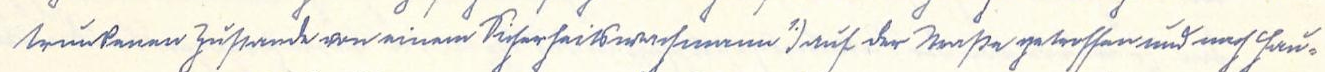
trunkenen Zustand von einem Sicherheitswachmann 1) auf der Straße getroffen und nach Hau-
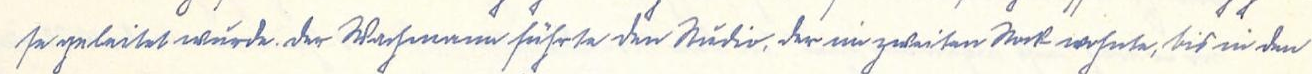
se geleitet wurde. Der Wachmann führte den Studio, der im zweiten Stock wohnte, bis in den
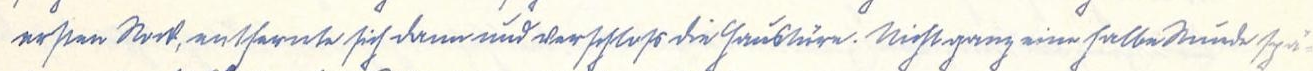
ersten Stock, entfernte sich dann und verschloß die Haustür. Nicht ganz eine halbe Stunde spä-
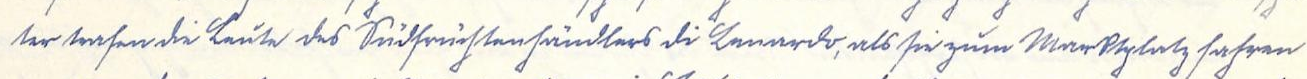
ter trafen die Leute des Südfrüchtenhändlers di Lenardo, als sie zum Marktplatz fahren
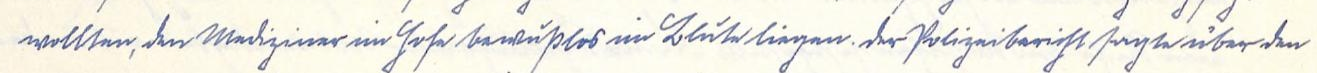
wollten, den Mediziner im Hof bewußtlos in Blut liegen. Der Polizeibericht sagte über den
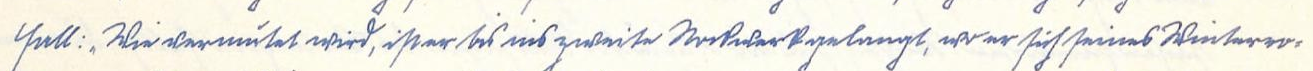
Fall: Wie vermutet wird, ist er bis ins zweite Stockwerk gelangt, wo er sich seines Winterro-
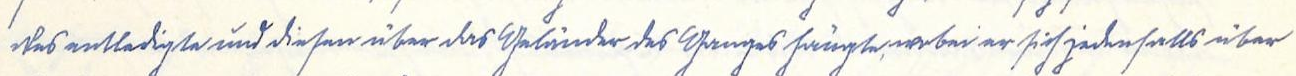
ckes entledigte und diesen über das Geländer des Ganges hängte, wobei er sich jedenfalls über
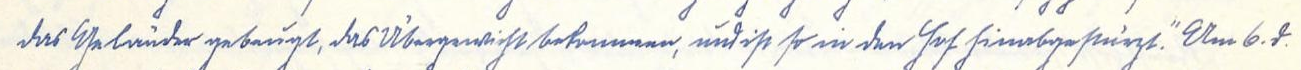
das Geländer gebeugt, das Übergewicht bekommen und ist so in den Hof hinabstürzt. Am 6. d.
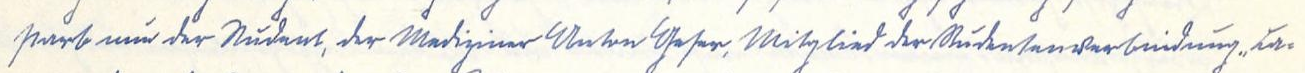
starb nun der Student, der Mediziner Anton Geser, Mitglied der Studentenverbindung „Ca-
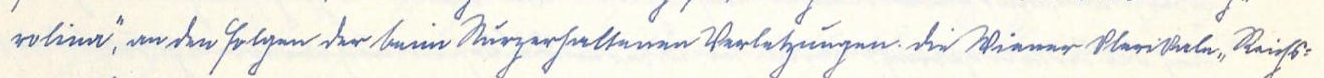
rolina“, an den Folgen der beim Sturz erhaltener Verletzungen. Die Wiener klerikale „Reichs-
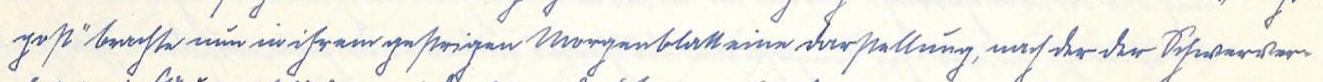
post“ brachte nun in ihrem gestrigen Morgenblatt eine Darstellung, auf der er Schwerver-
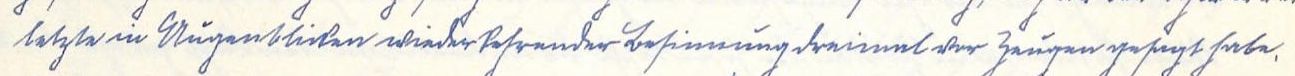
letzte in Augenblicken wiederkehrender Besinnung dreimal vor Zeugen gesagt habe,
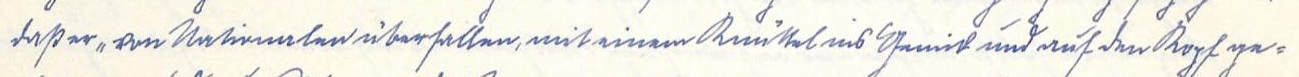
dass er „von Nationalen überfallen, mit einem Knüttel ins Genick und auf den Kopf ge-
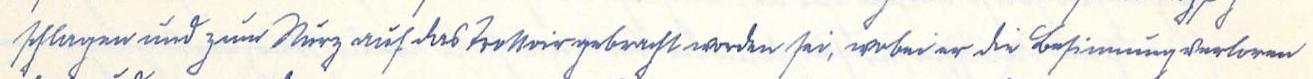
schlagen und zum Sturz auf das Trottoir gebracht worden sei, wobei er die Besinnung verloren
